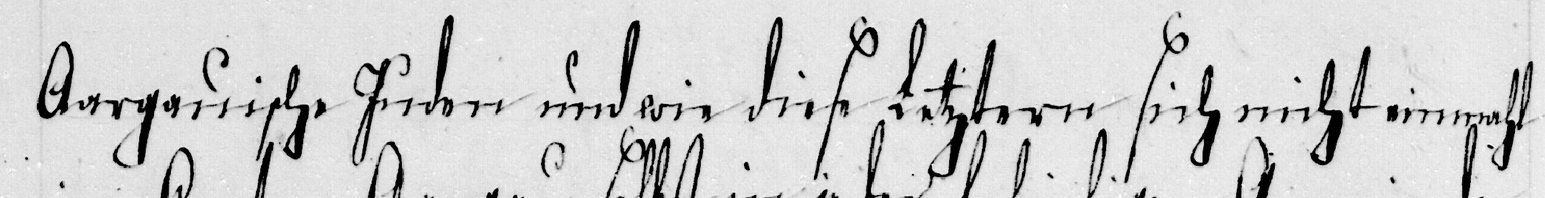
Aargauische Juden und wie diese Letztern sich nicht einmahl
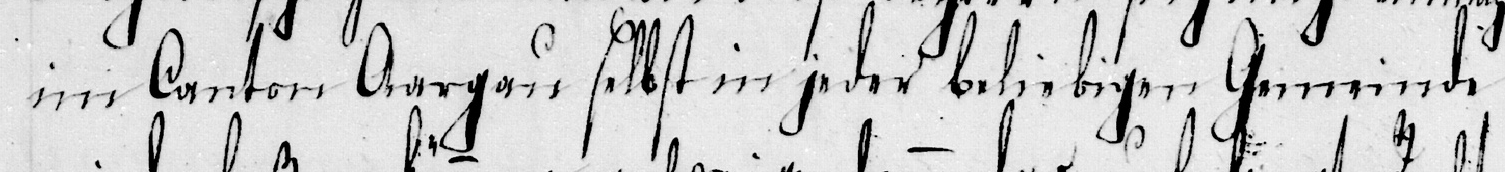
im Canton Aargau selbst in jeder beliebigen Gemeinde
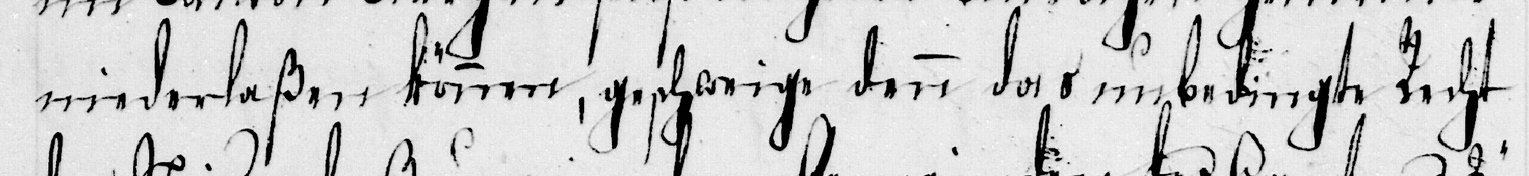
niederlaßen können, geschweige denn das unbedingte Recht
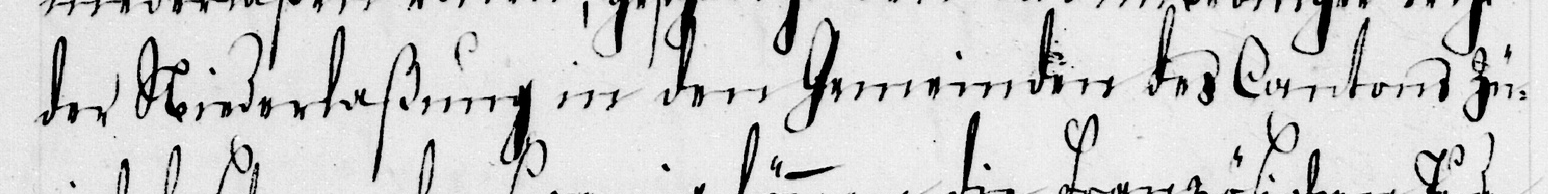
der Niederlaßung in den Gemeinden des Cantons Zü¬
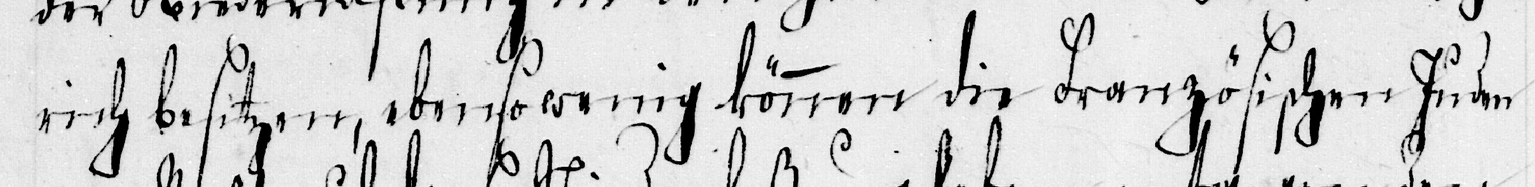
rich besitzen, ebensowenig können die Französischen Juden
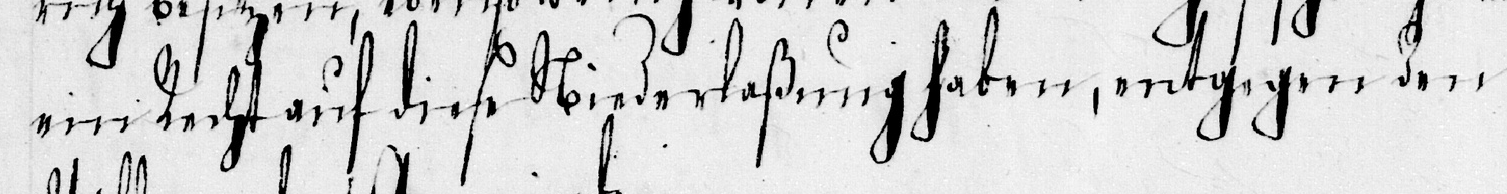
ein Recht auf diese Niederlaßung haben, entgegen den
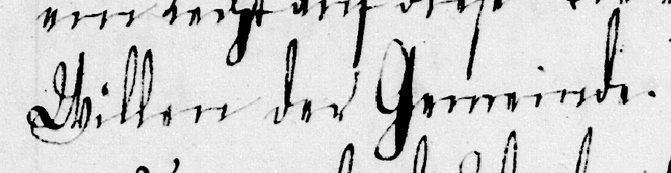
Willen der Gemeinde.
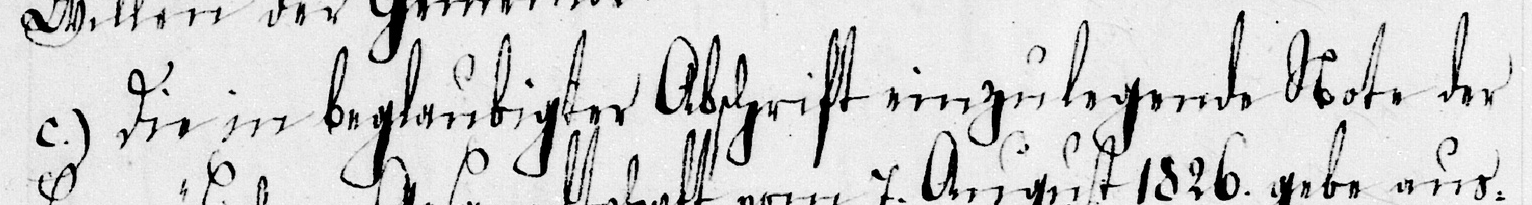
c.) Die in beglaubigter Abschrift einzulegende Note der
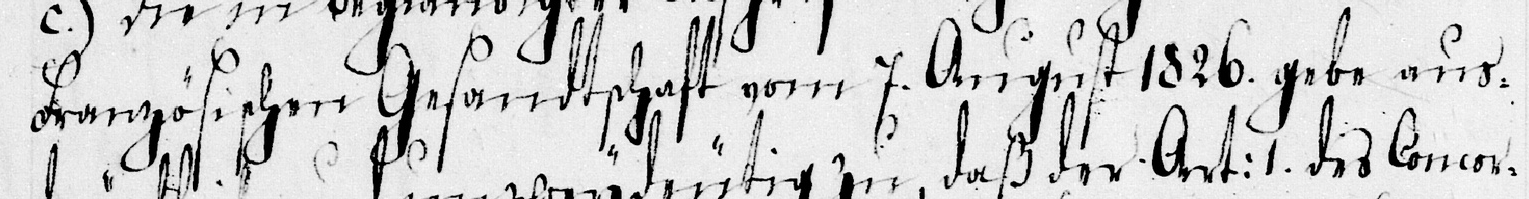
Französischen Gesandtschaft vom 7. August 1826. gebe aus¬
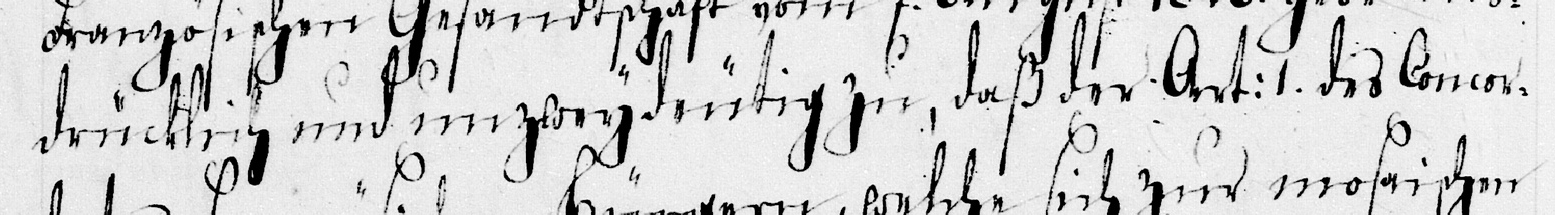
drücklich und unzweydeutig zu, daß der Art: 1 des Concor¬
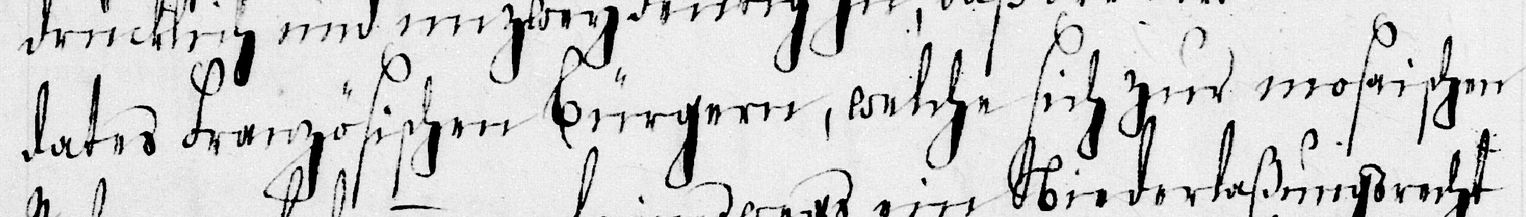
dates Französischen Bürgern, welche sich zur mosaischen
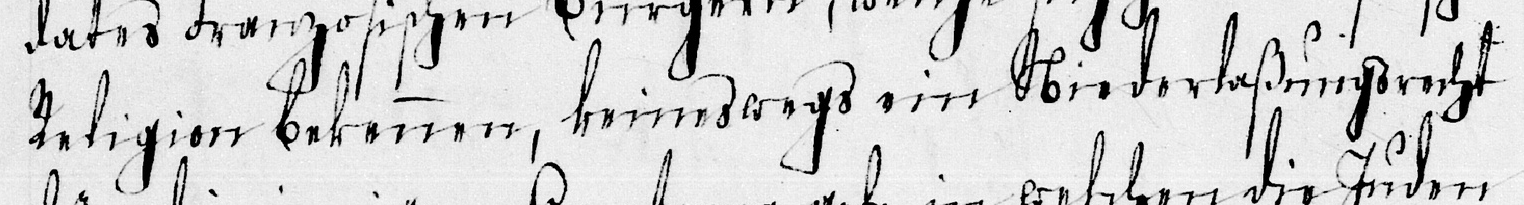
Religion bekennen, keineswegs ein Niederlaßungsrecht
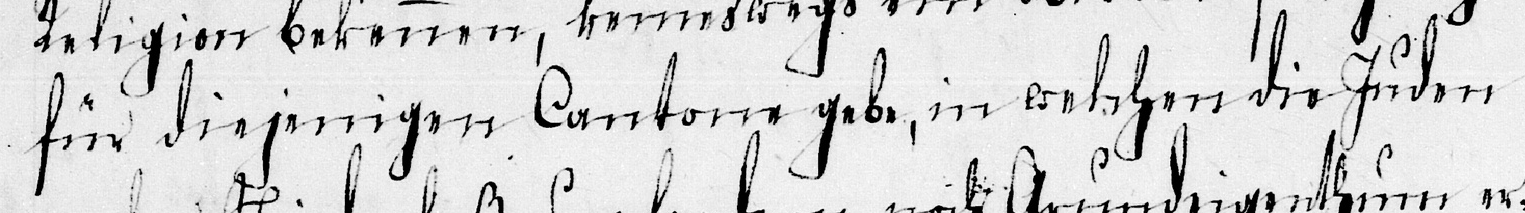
für diejenigen Cantone gebe, in welchen die Juden
